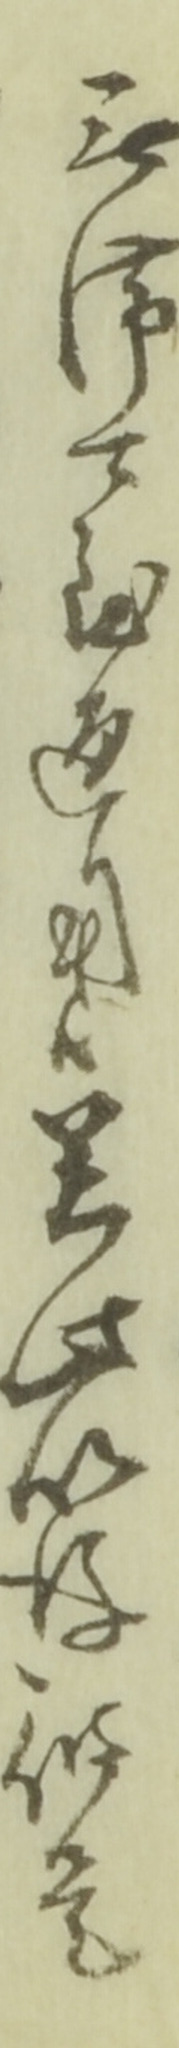無滞可其趣通用候程此心得彼是
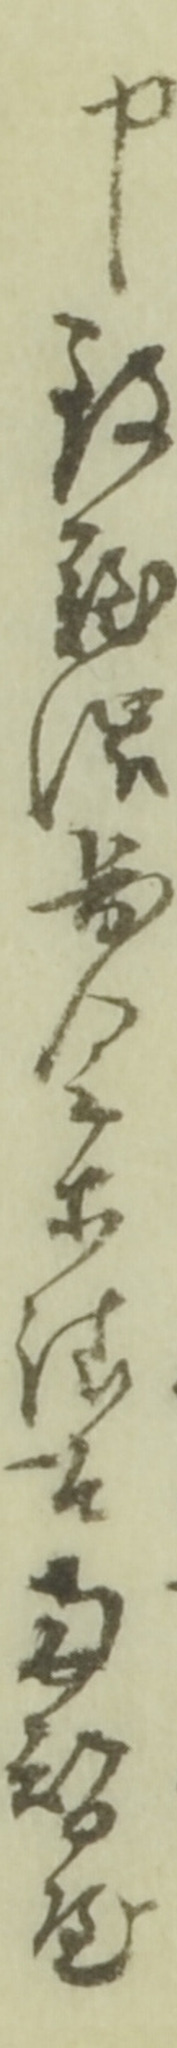中致難渋図金等請取両替屋
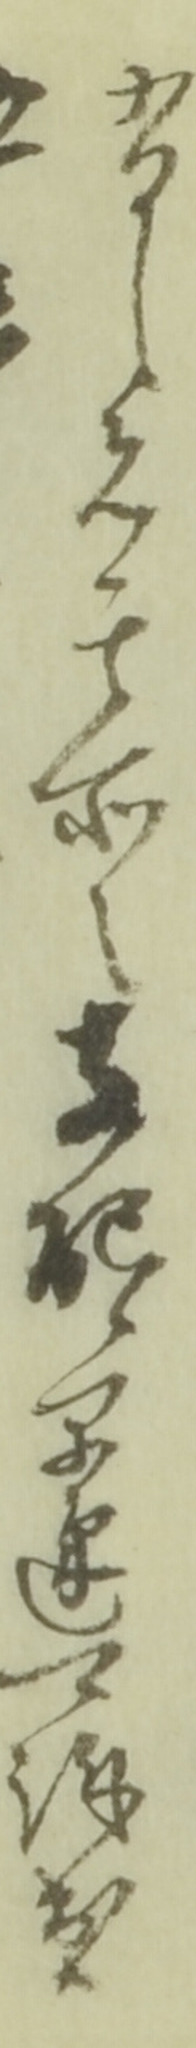有之候者其所之支配二早速可訴出候
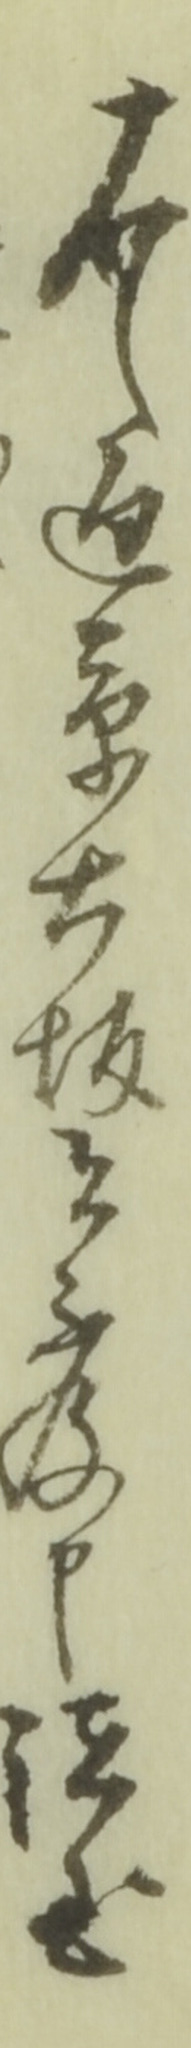右之通り京大坂者不及申諸国
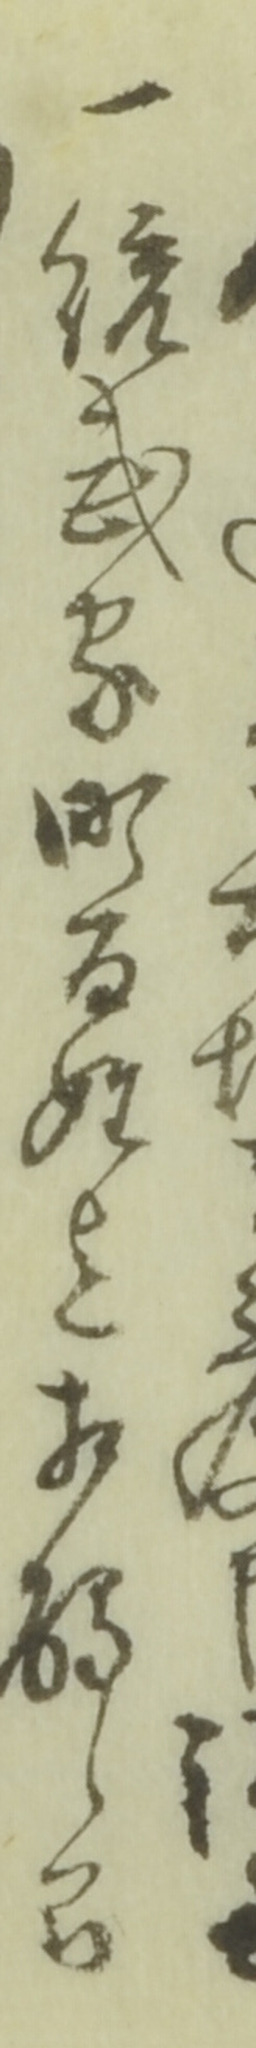一統武家町百姓迄相触候間
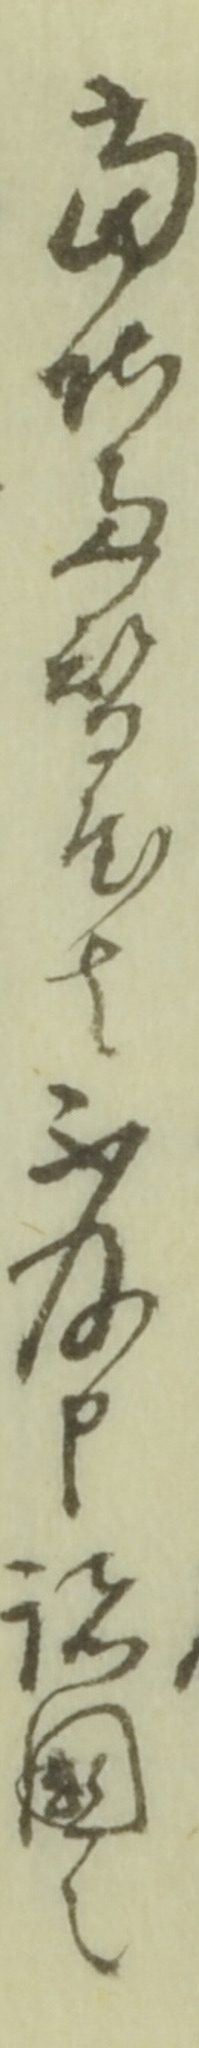当地両替屋者不及申諸国之
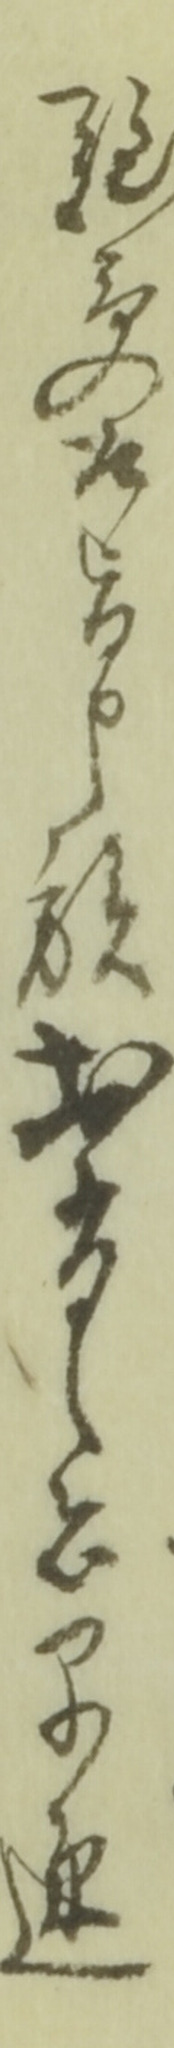難受取旨申候族おいて者早速
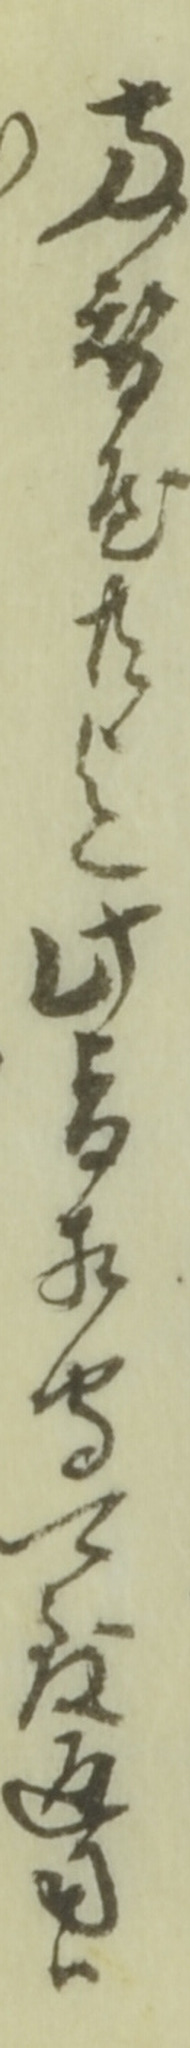両替屋共迄此旨相守可致通用候
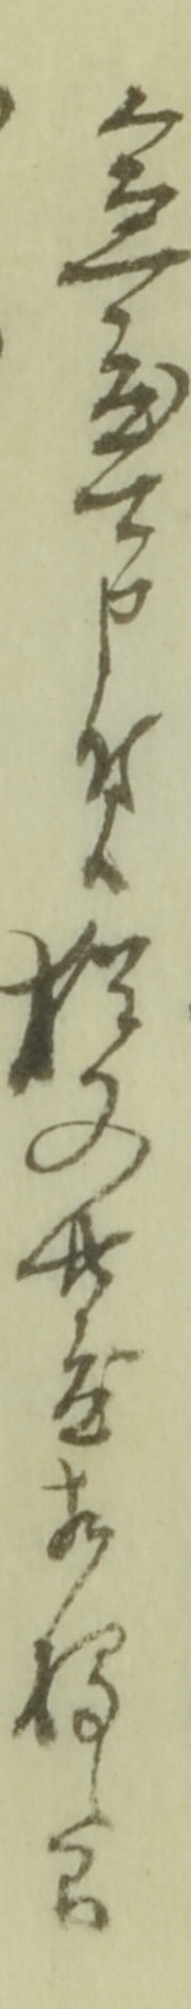急度可申付候猶又此度相触候旨
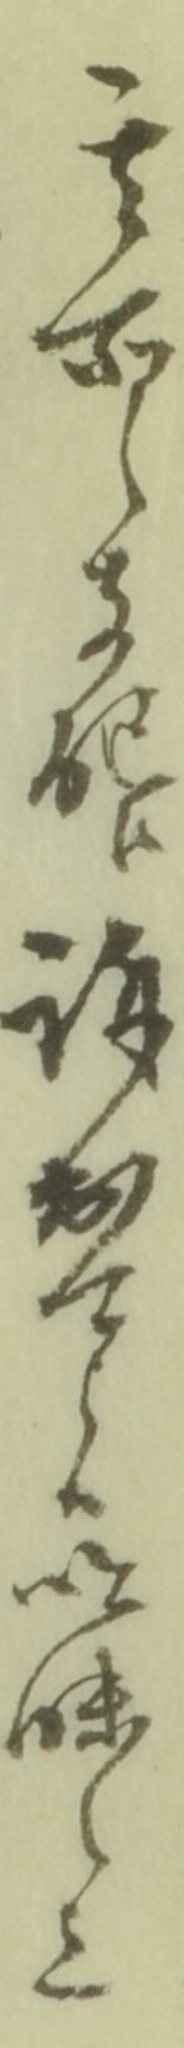其所之支配候訴出可候吟味之上
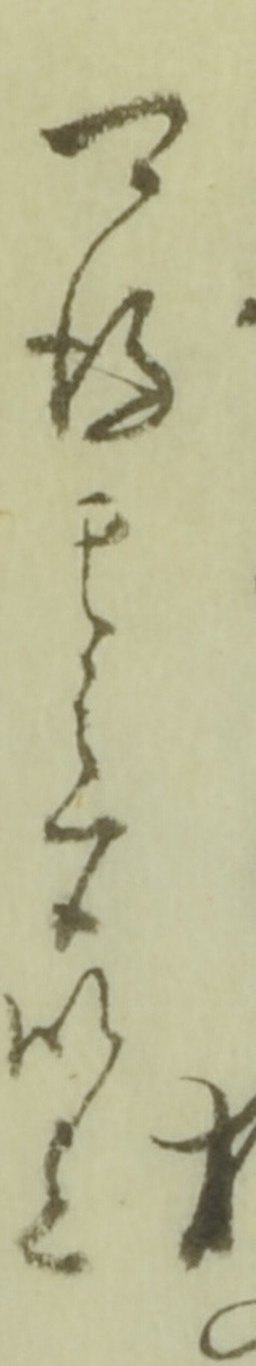可得其旨候以上
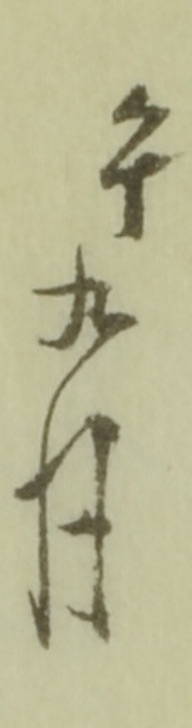午九月
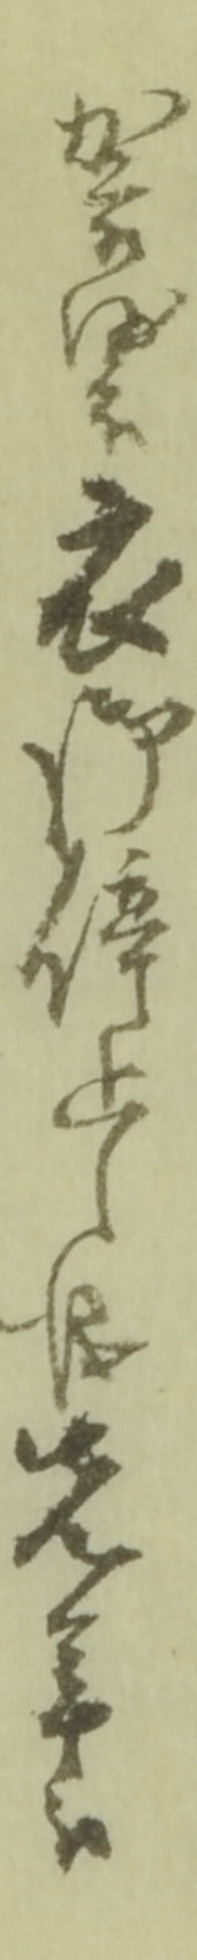袈裟衣御停止候儀先年被
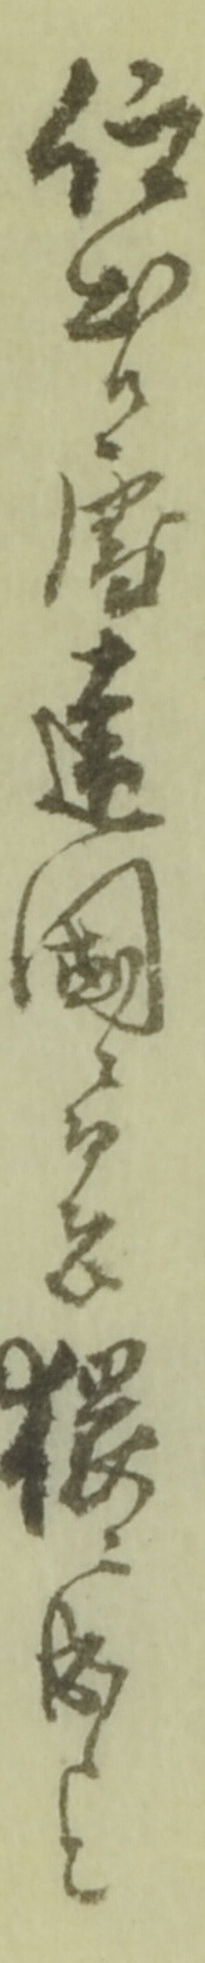仰出候處遠国に而者猥二成候と
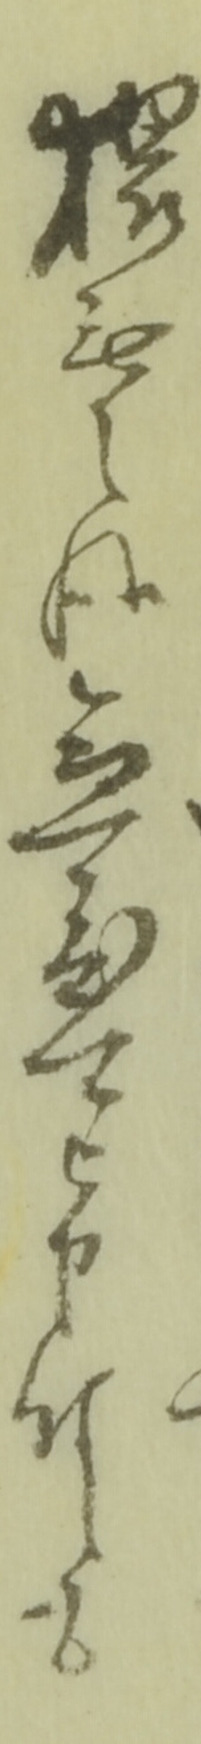猥無之様急度可被申付候以上
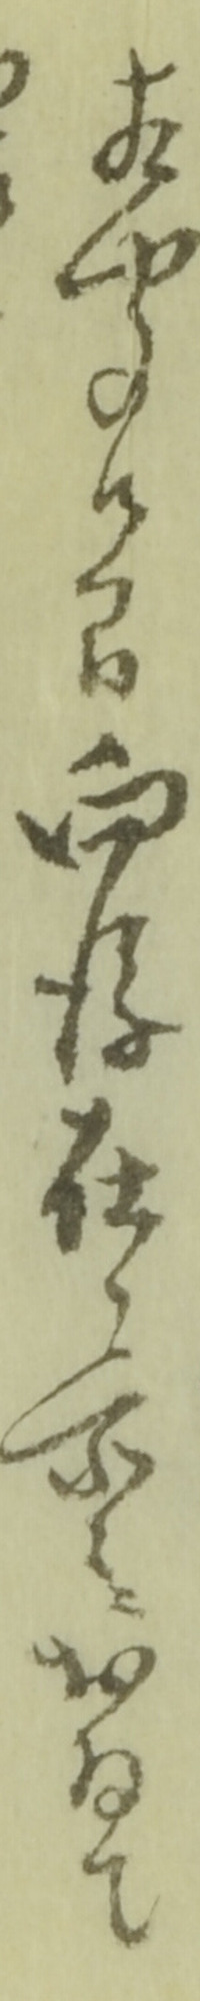相聞候間向後在々所々二おいて
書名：御公儀様御領主様御触書控
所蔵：伊那市立高遠町図書館・合同会社AMANE
